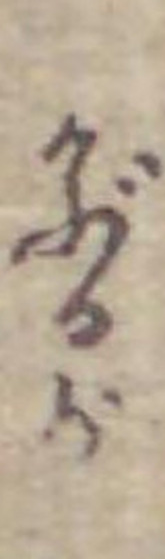かぶるが

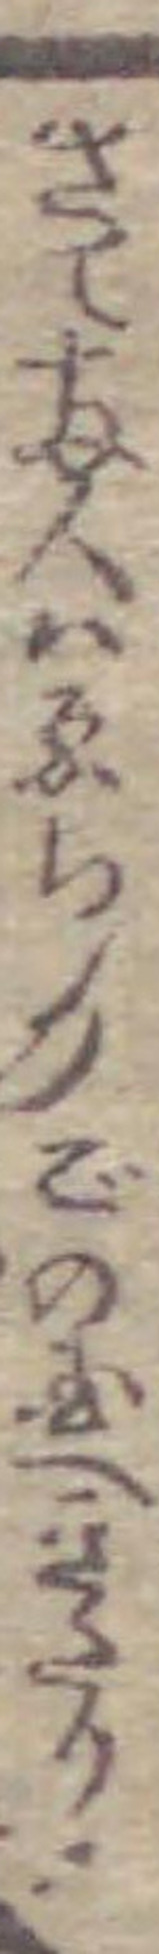さて両人はゑちごの国へきたり
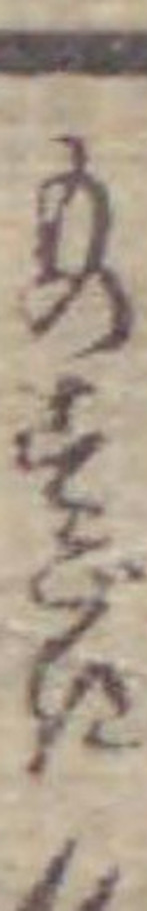ものすごき
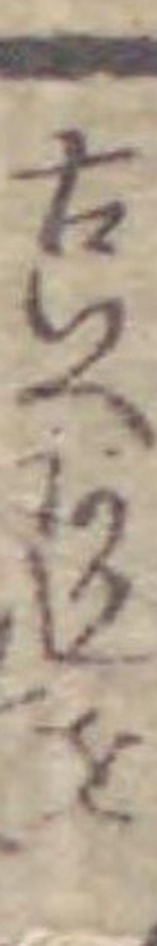古いへありしを
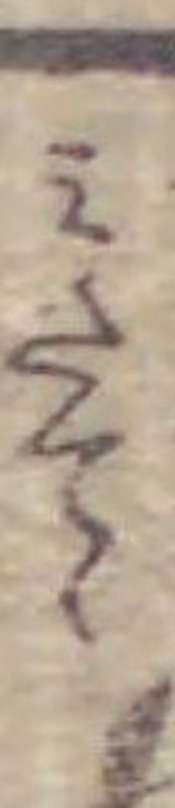みたてゝ
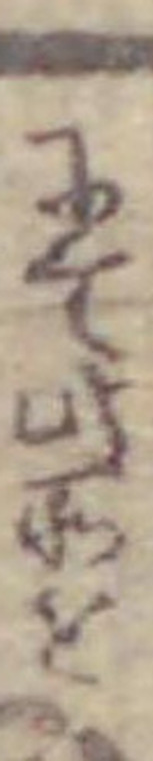にて此所を
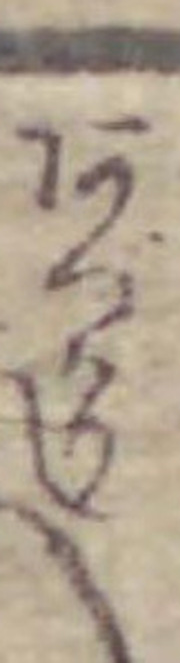あづかりし
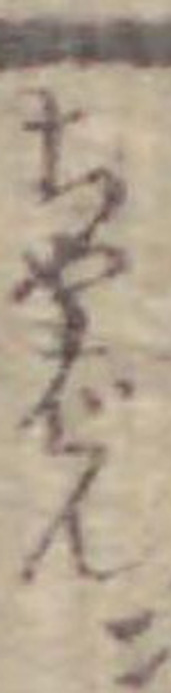ちやばん
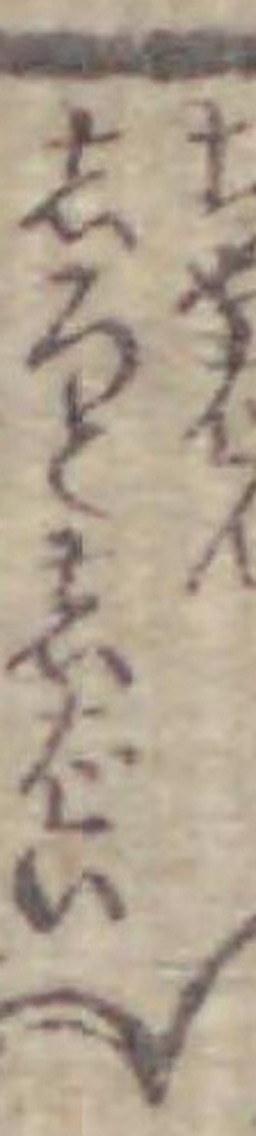しろとしばい
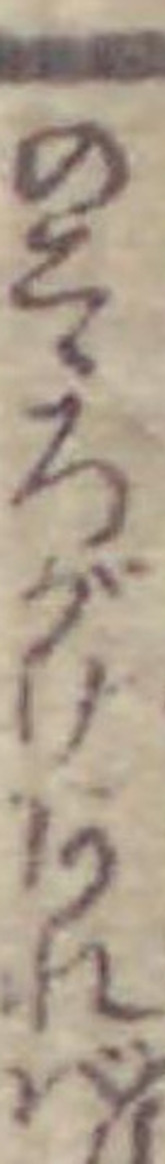のこゝろがけあれば
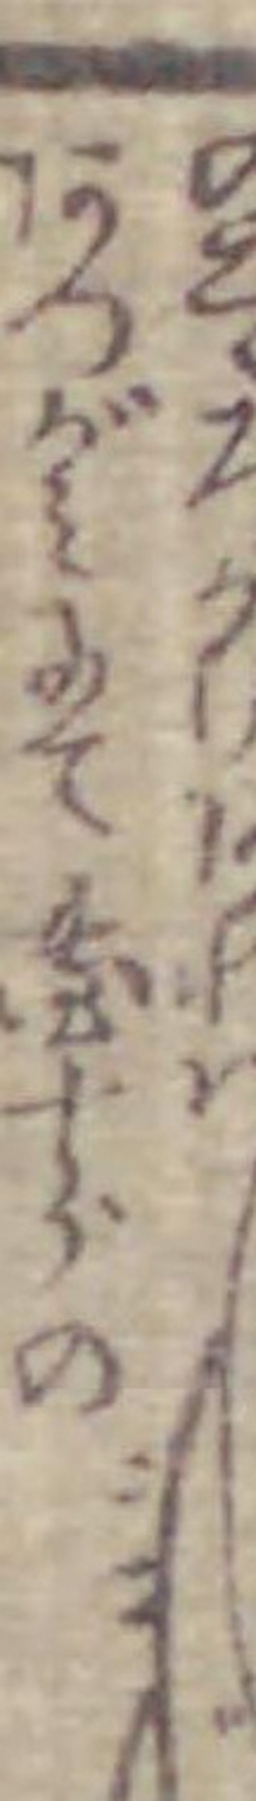あつがみにて団十郎の
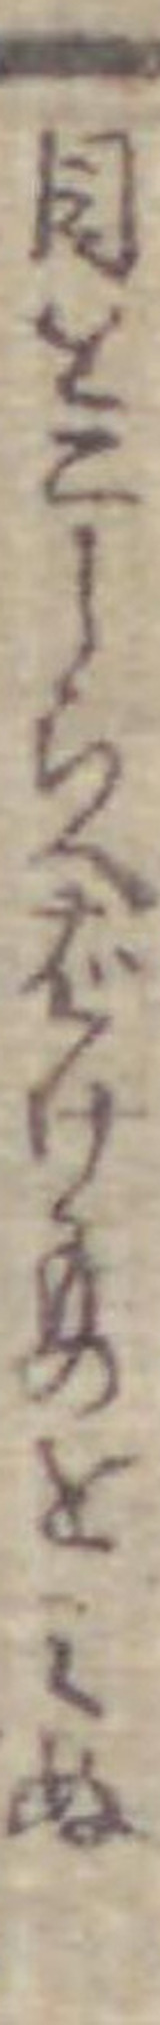目をこしらへばけものをみぬ
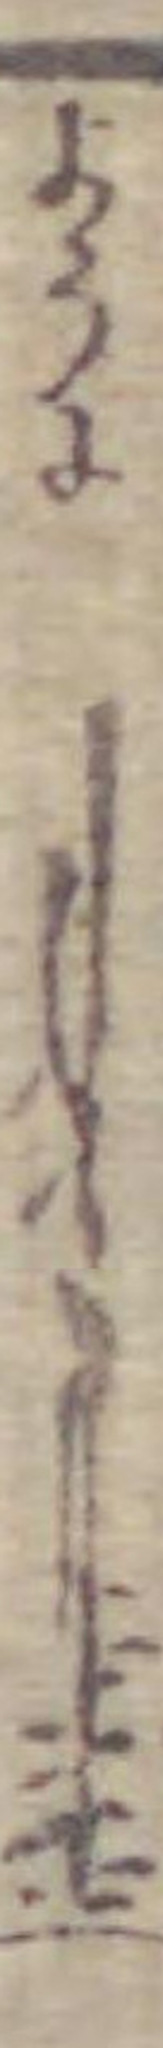ように
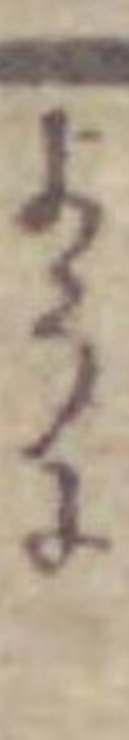ように
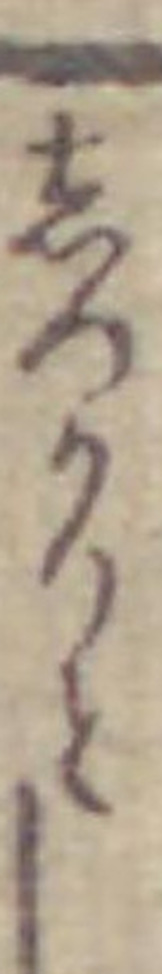しつかりと
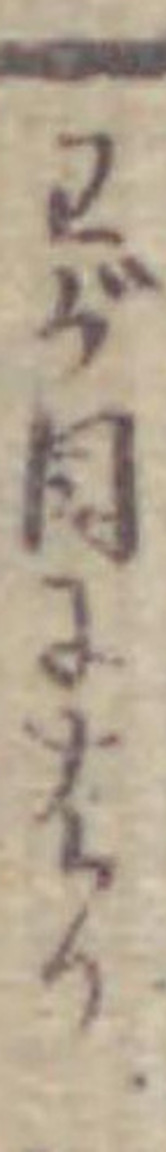わが目にはり
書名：二日替 : 2巻
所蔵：国立国会図書館 National Diet Library, JAPAN
